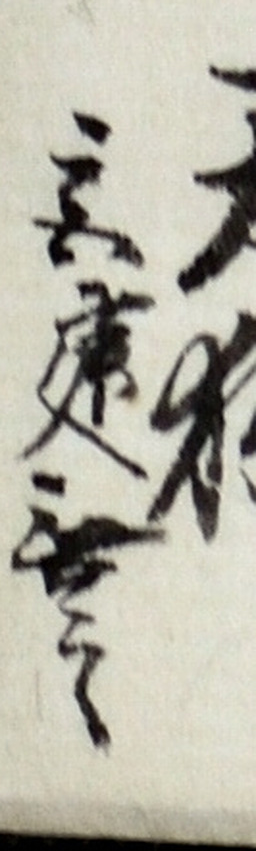宮建無之
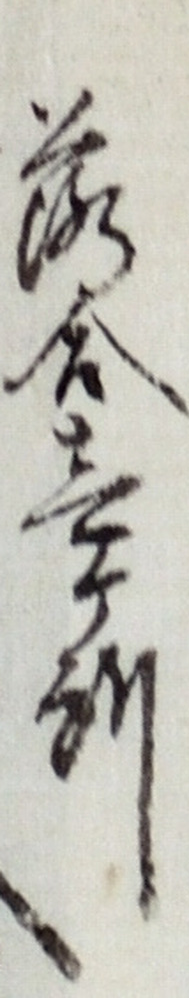落合壱ヶ所
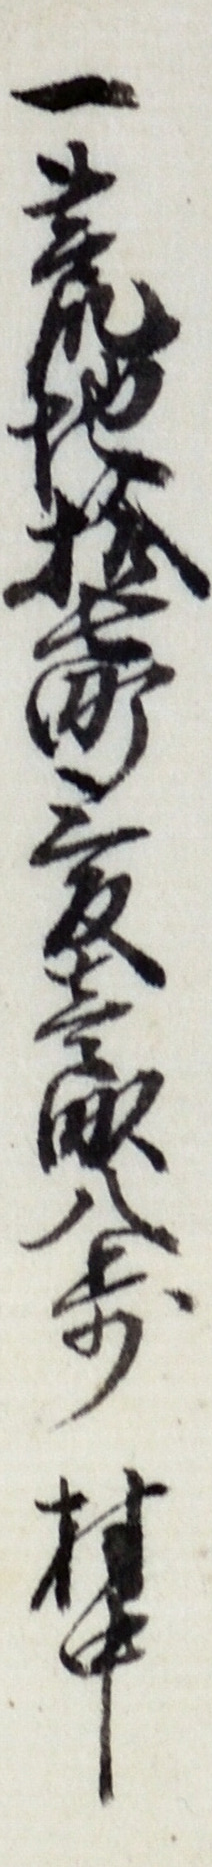一荒地拾七町三反壱畝八歩村中
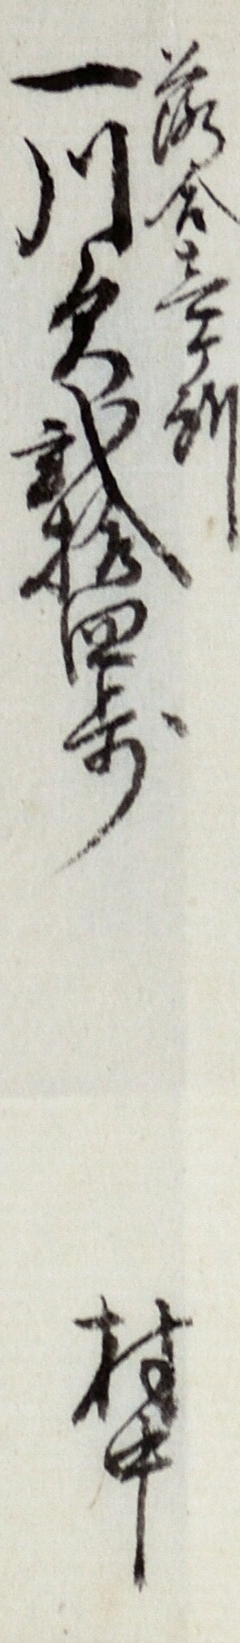一川欠弐拾四歩村中
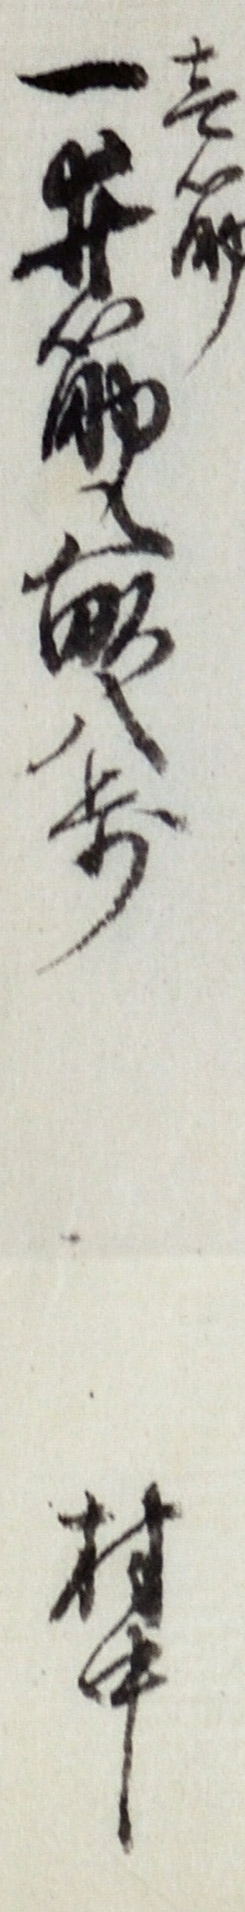一井筋八畝八歩村中
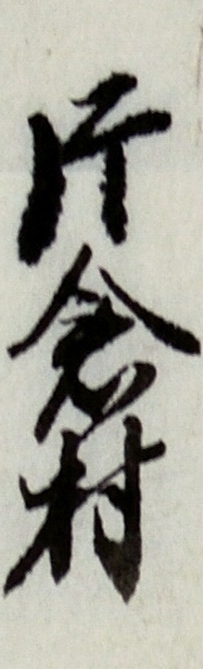片倉村
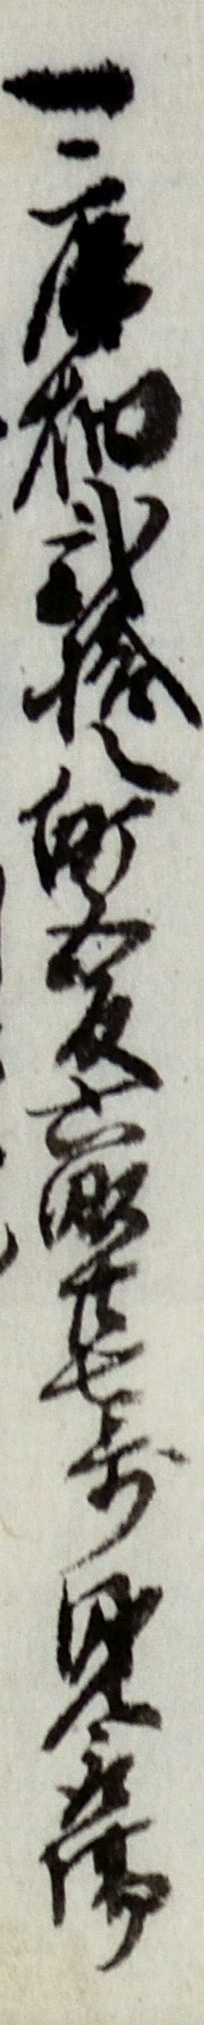一麻畑弐拾八町五反六畝廿七歩見取場
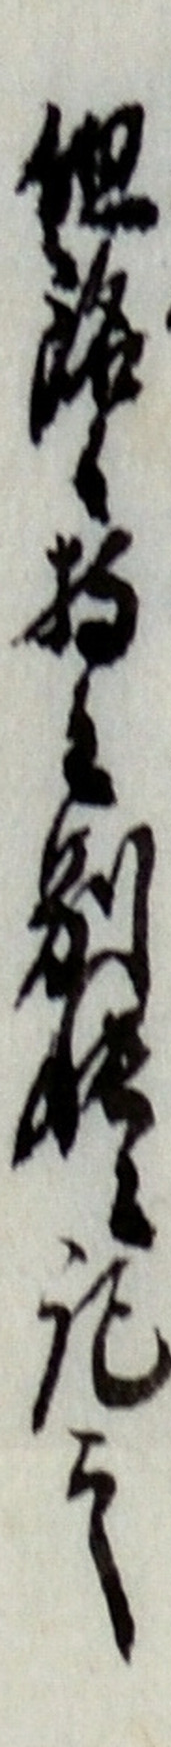但銘々持主別帳ニ記之
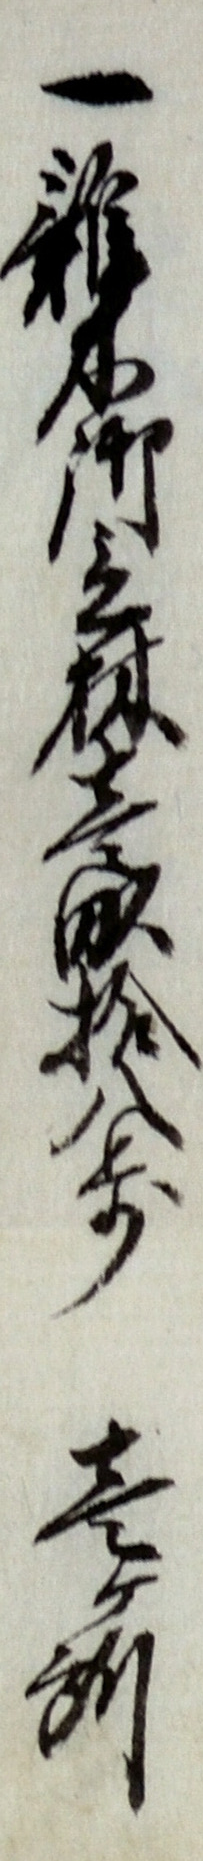一雑木御立柱壱畝拾八歩壱ヶ所

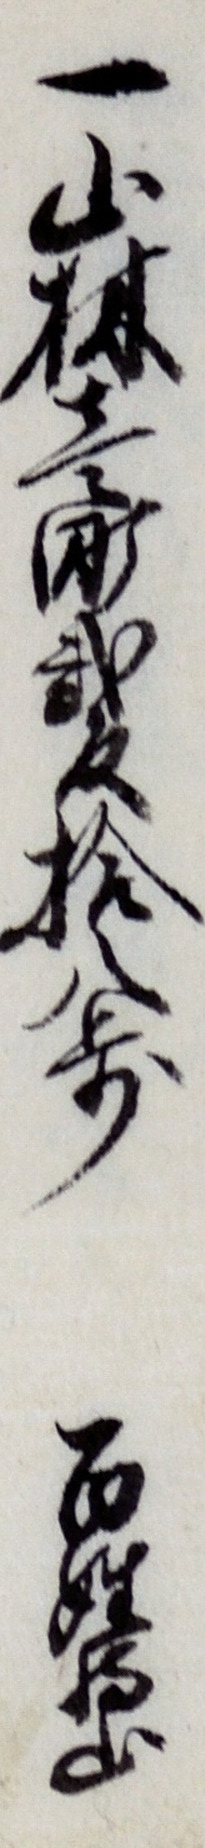一山林壱町弐反拾八歩百姓持山
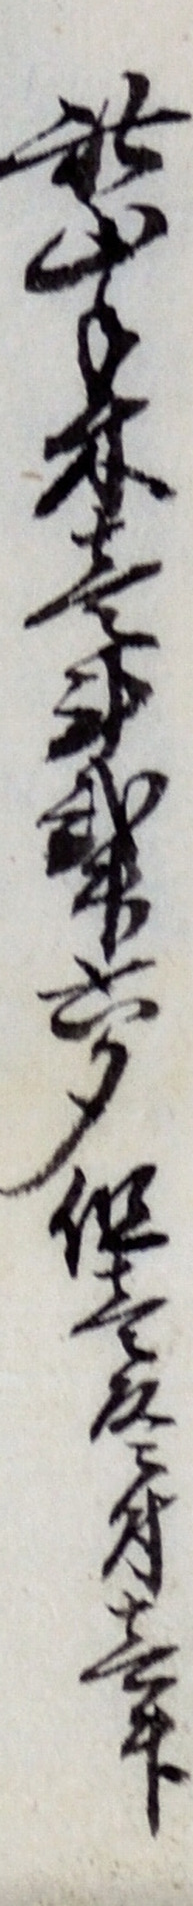此山手米壱斗弐升六夕但壱反ニ付壱升
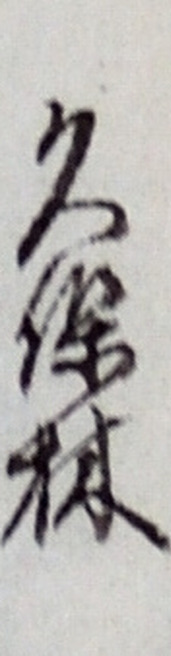久保林
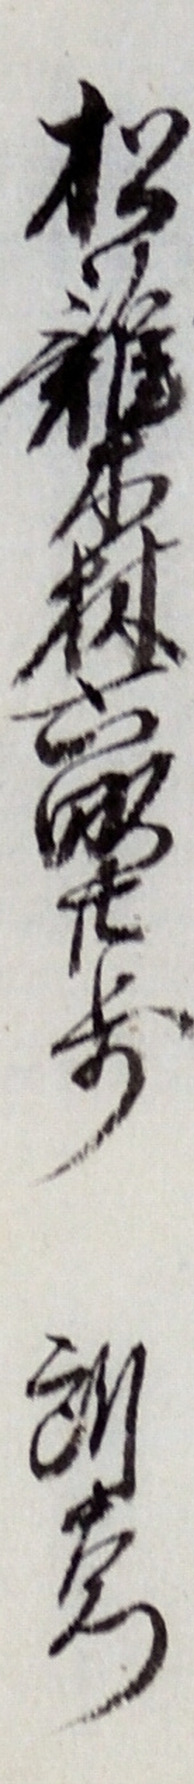松雑木林六畝廿歩所右衛門
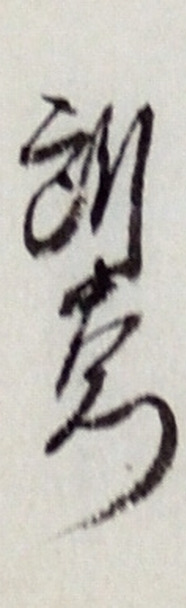庄右衛門
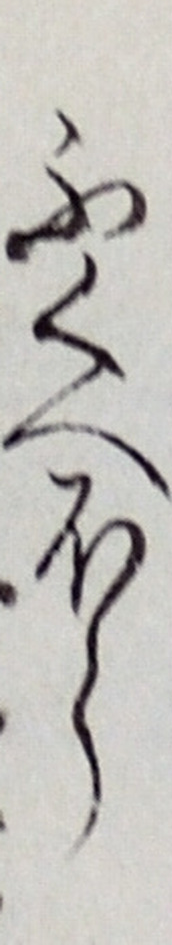ふくへほら
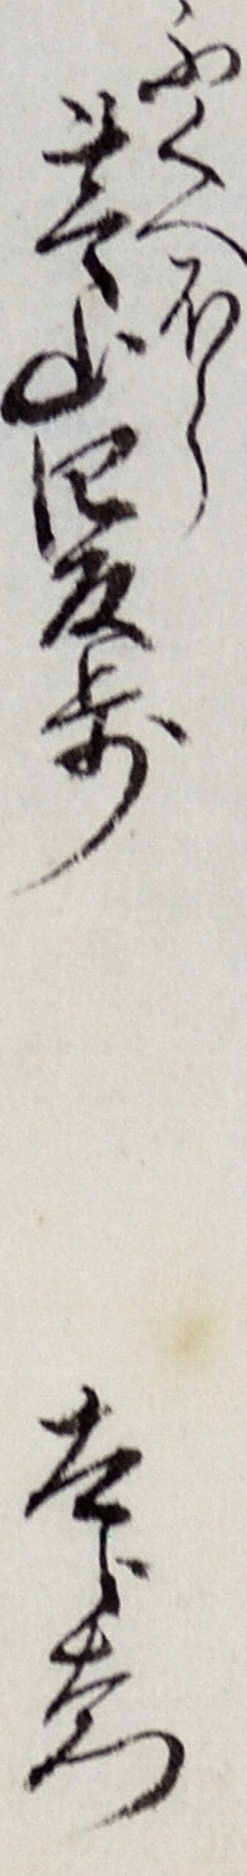芝山四反歩太郎右衛門
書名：御領分中山林社地手控
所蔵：伊那市立高遠町図書館・合同会社AMANE
